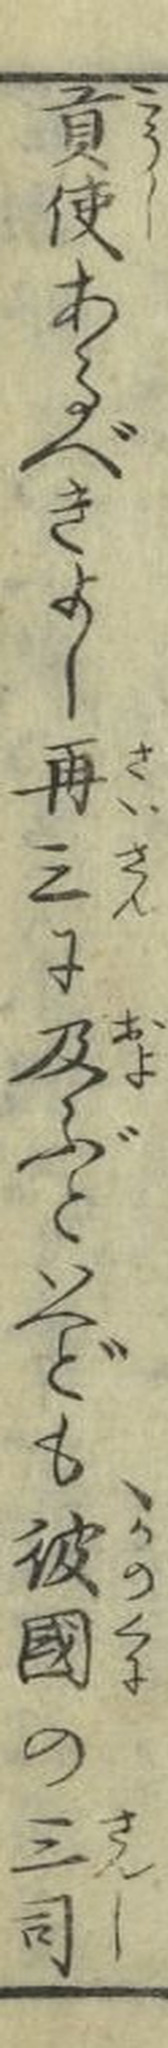貢使あるべきよし再三に及ぶといへども、彼国の三司

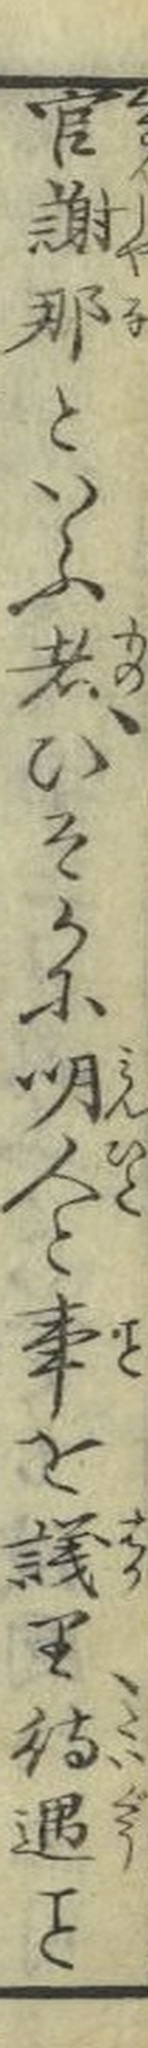官謝那といふ者、ひそかに明人と事を議り、待遇こと
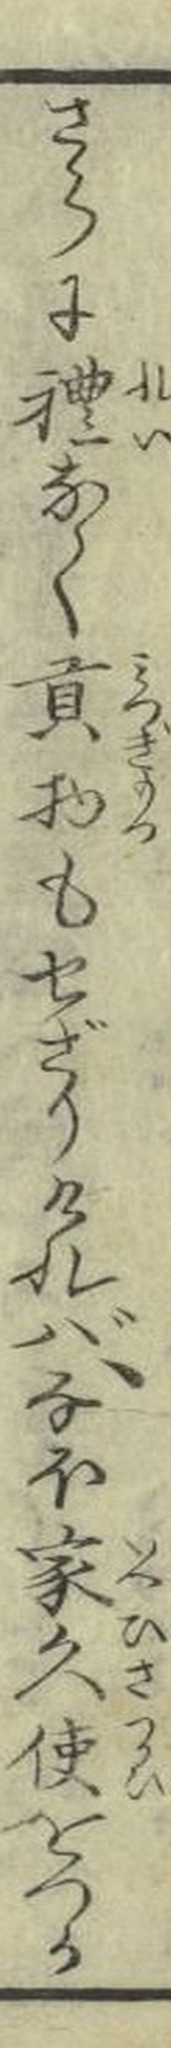さらに礼なく貢物もせざりければ、なほ家久使をつか
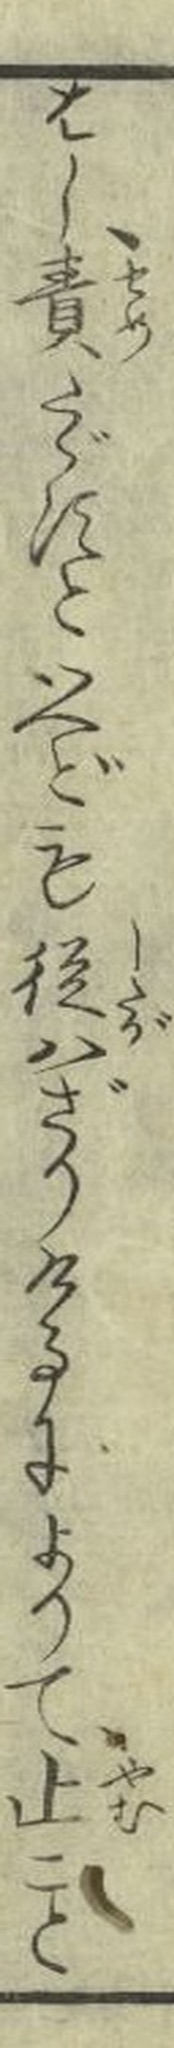はし、責たゞすといへども従はざりけるによりて、止こと
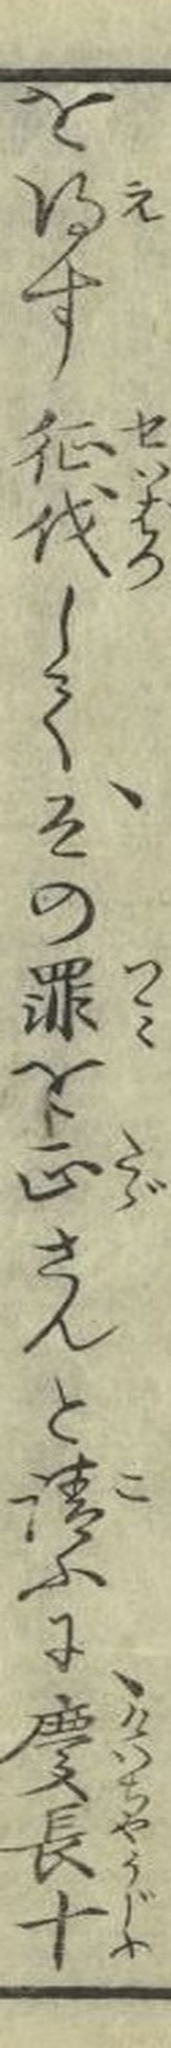を得す征伐して、その罪を正さんと請ふに、慶長十
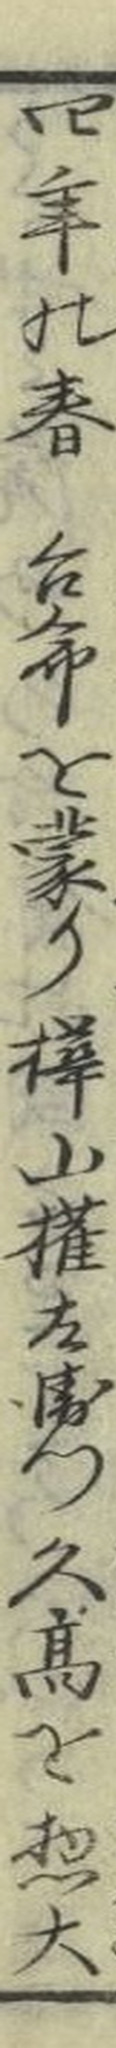四年の春台命を蒙り、樺山権左衛門久高を惣大
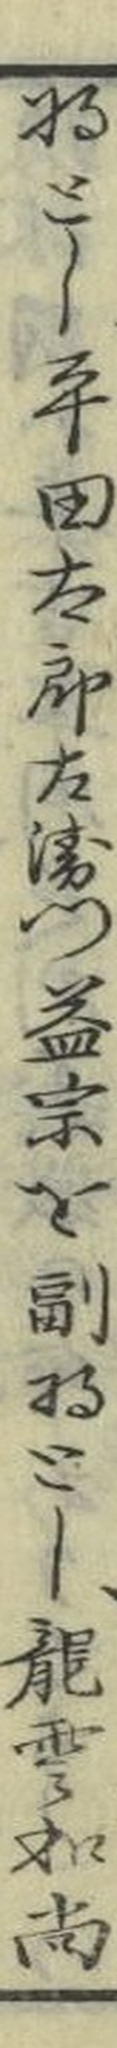将とし、平田太郎左衛門益宗を副将とし、龍雲和尚
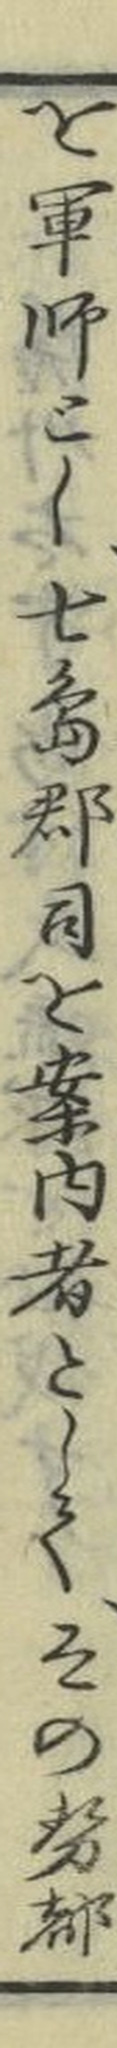を軍師とし、七島郡司を案内者として、その勢都
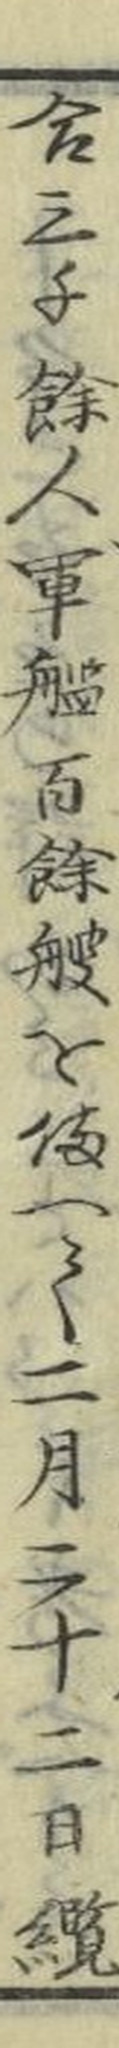合三千余人、軍艦百余艘を備へて、二月二十二日纜
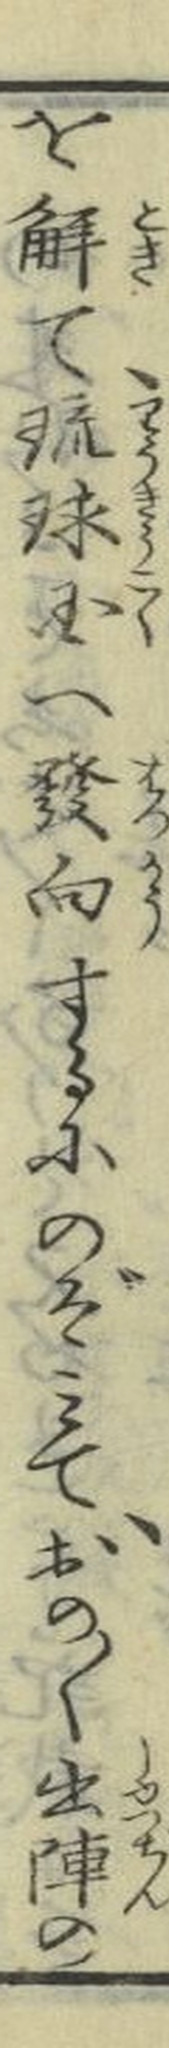を解て、琉球国へ発向するにのぞみて、おの〳〵出陣の
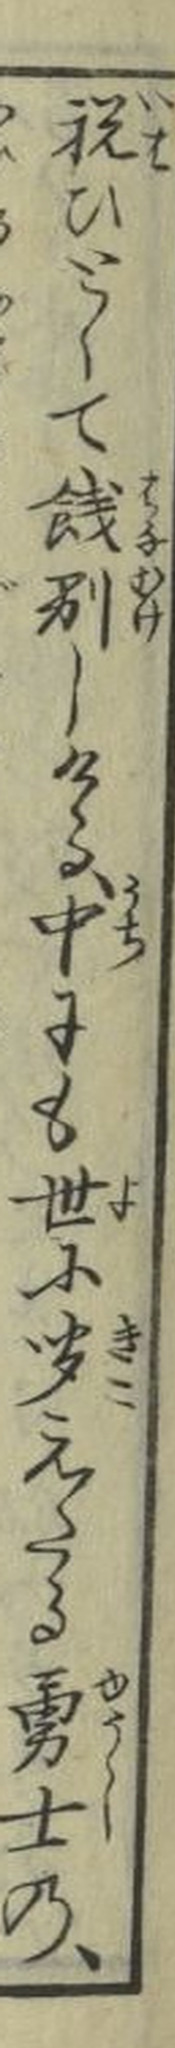祝ひとして餞別しける、中にも世に聞えたる勇士の、
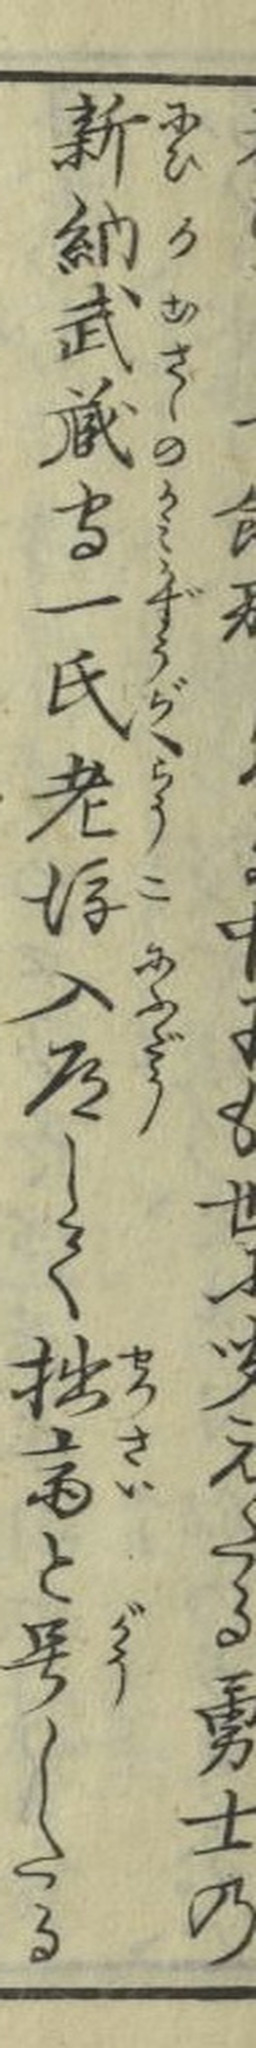新納武蔵守一氏、老後入道して拙斉と号したる
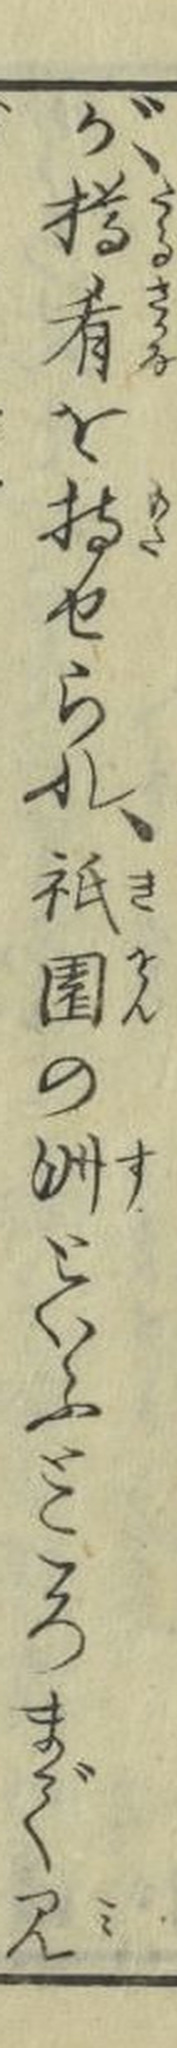が、樽肴を持せられ、祇園の洲といふところまで見
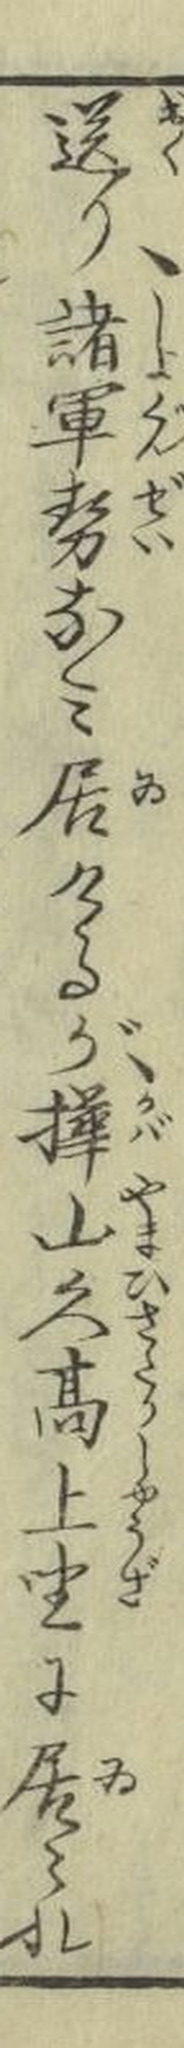送り、諸軍勢なみ居けるが、樺山久高上坐に居られ
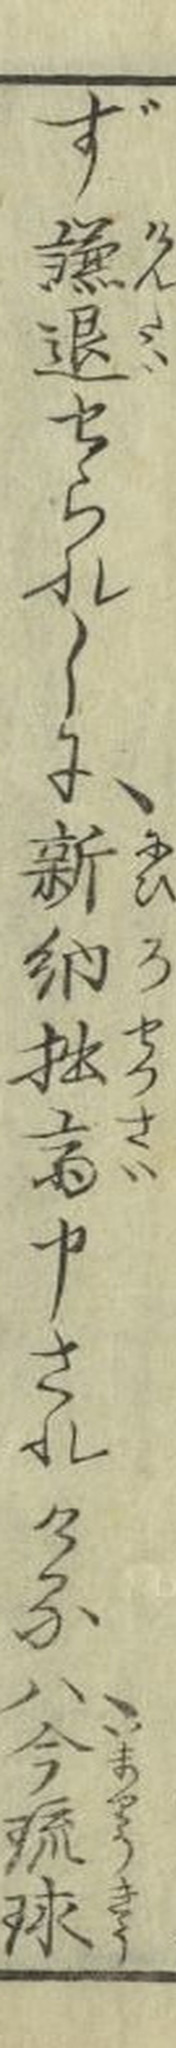ず謙退せられしに、新納拙斉申されけるは、今琉球
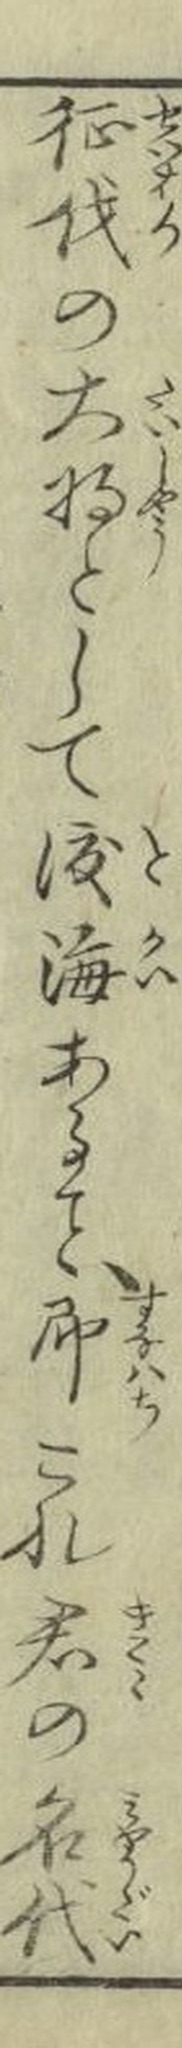征伐の大将として渡海あること、即これ君の名代
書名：琉球入貢紀略
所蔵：University of the Ryukyus Library
